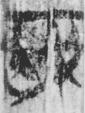○（癘）
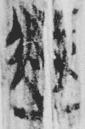役（疫）
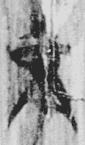不
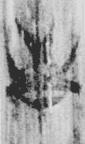至
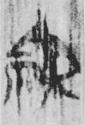○（妖）
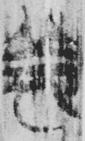羕（祥）
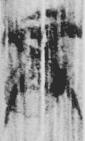不
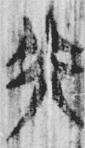行
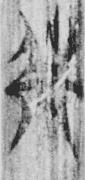○（禍）
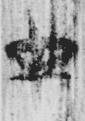才（災）
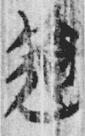迲（去）
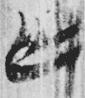亡
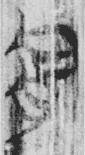○（禽）
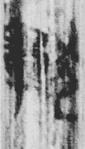獸（兽）
